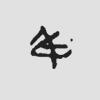身
